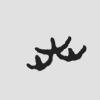卉
